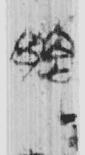航
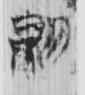則
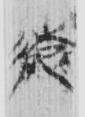{彳袁}
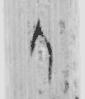人
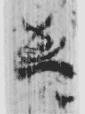至
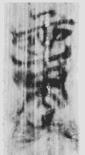商
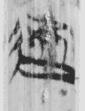{辶旅}
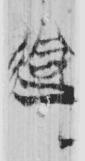迵
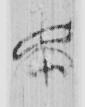民
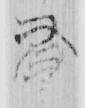有
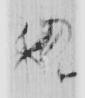利
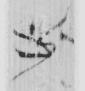此
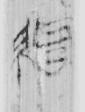紿
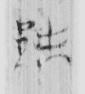邦
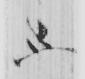之
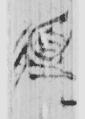道
